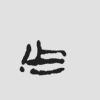乍
